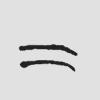二
